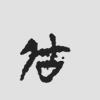居
